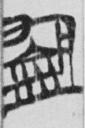鈞（均）
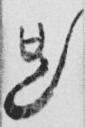也
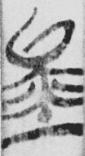○（舜）
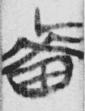○（嗇）
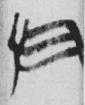於
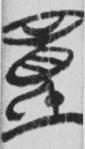童
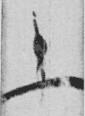土
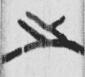之
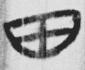田
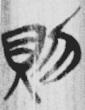則（則）
